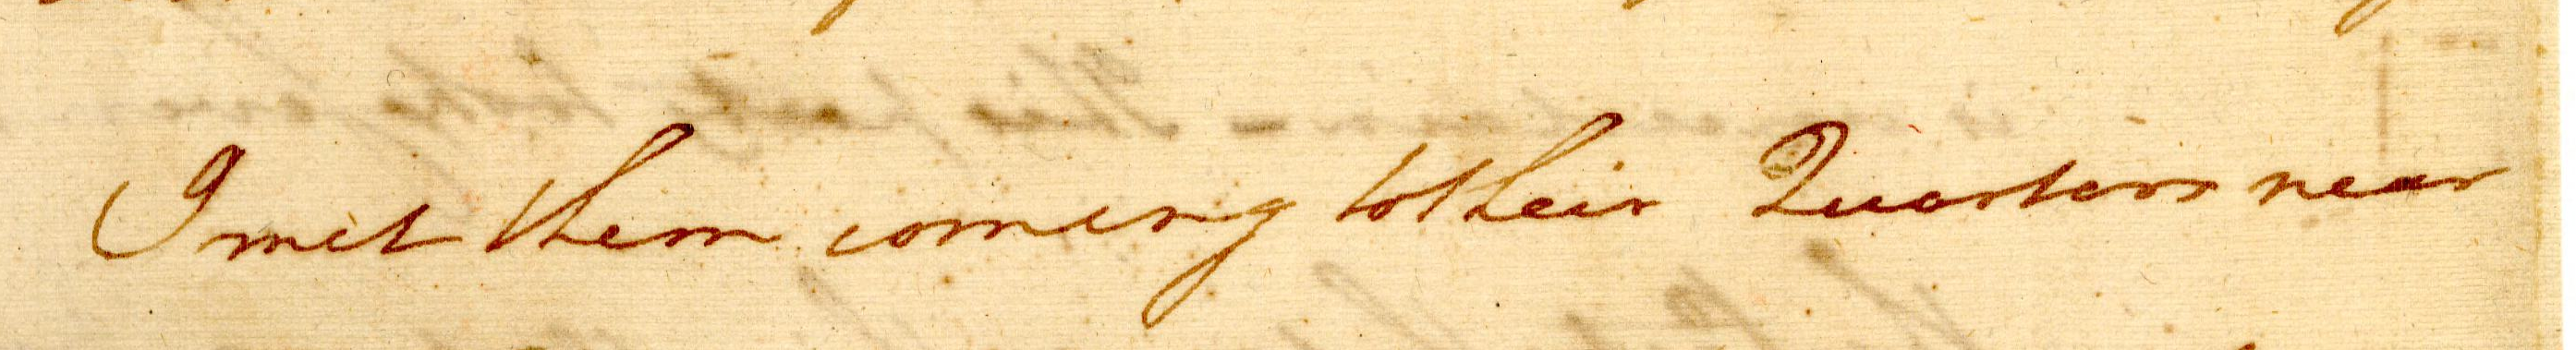I met them coming to their Quarters near
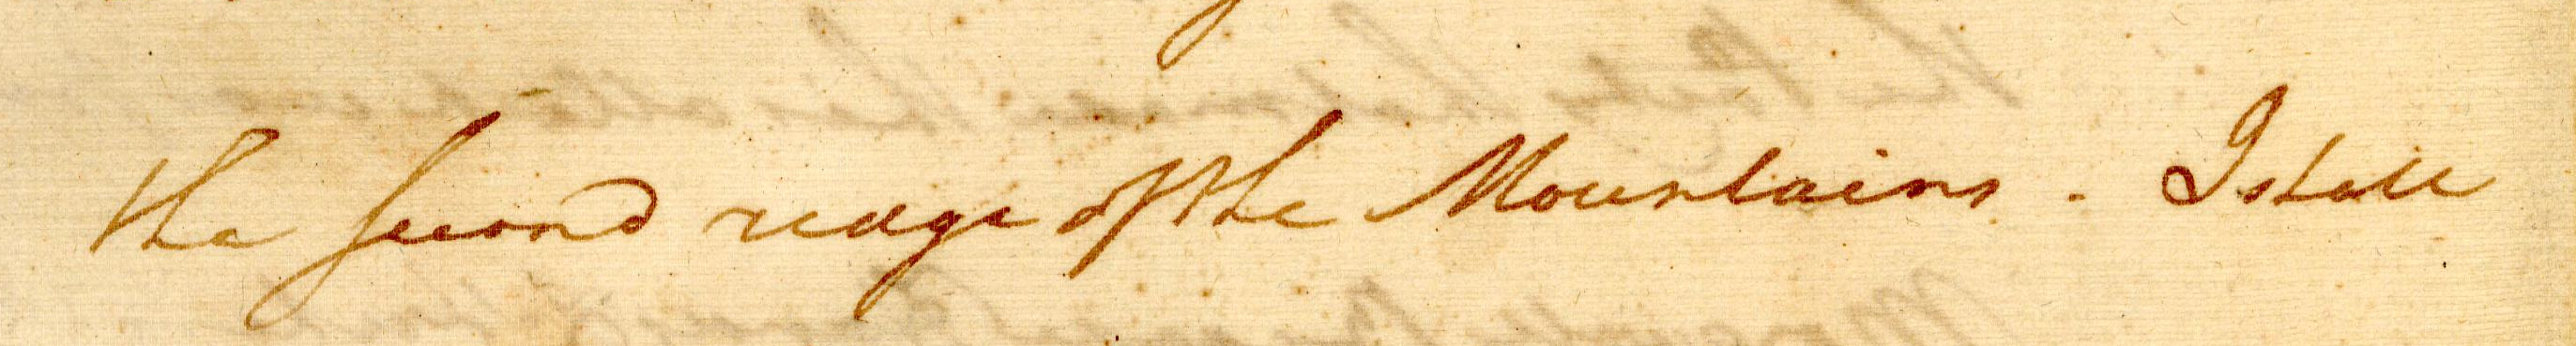the second ridge of the Mountains. I shall
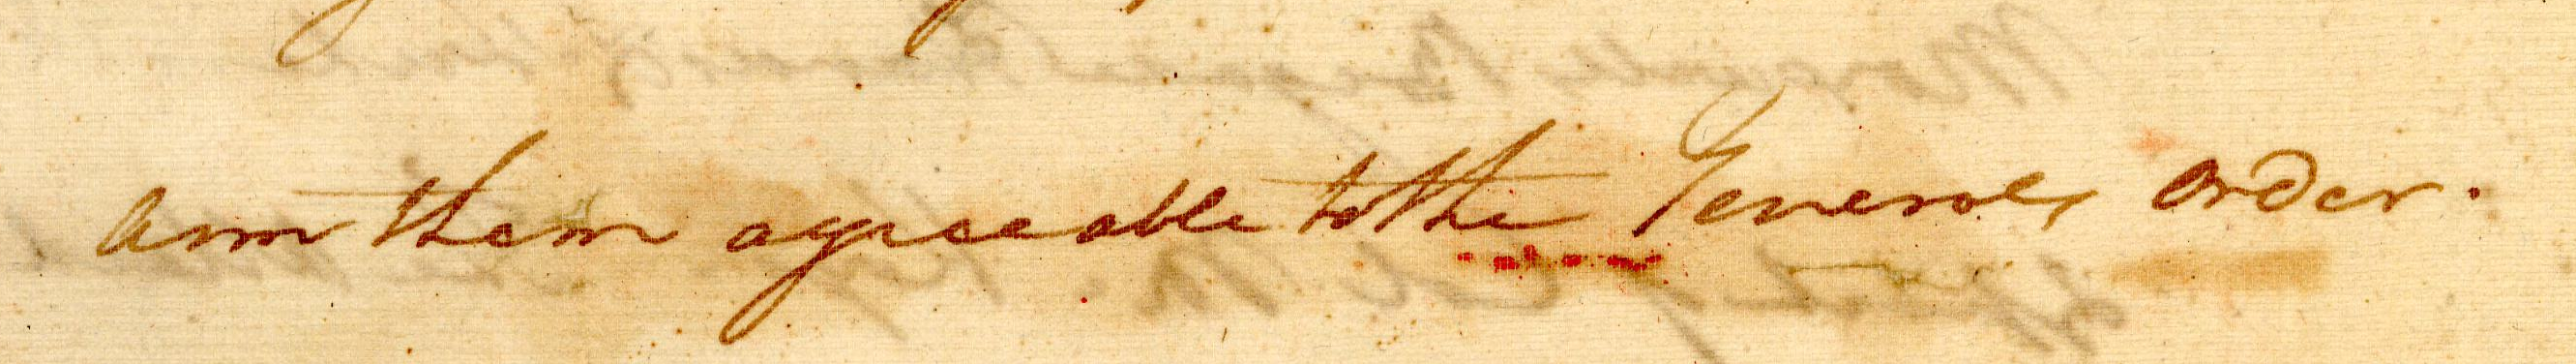arm them agreeable to the Generals order.
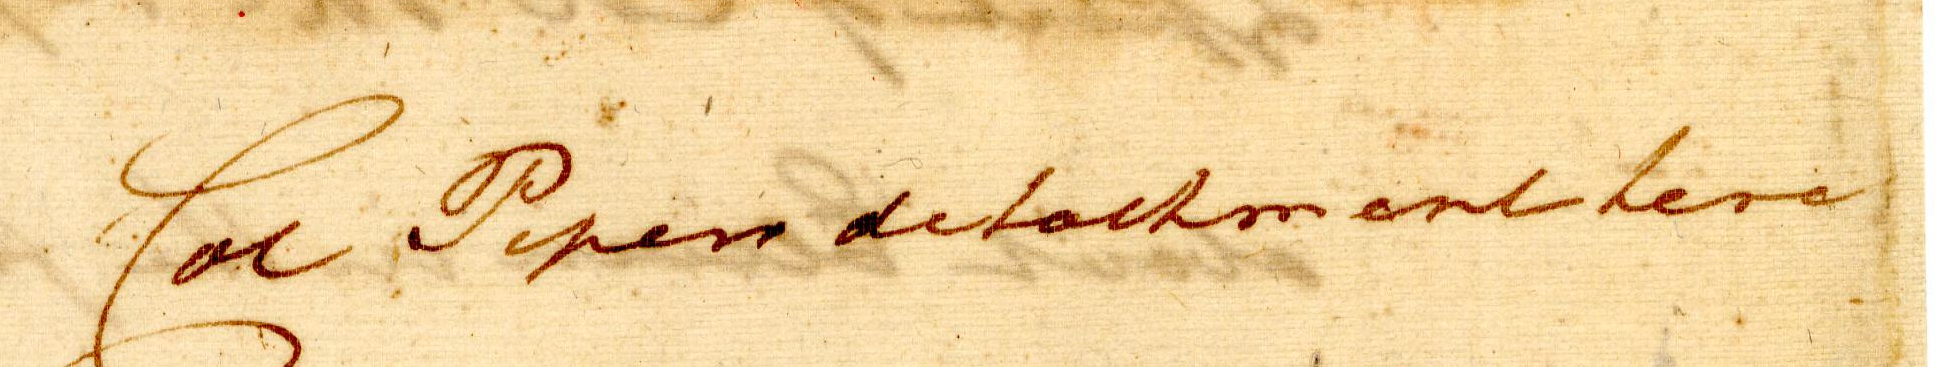Col Pipers detachment here
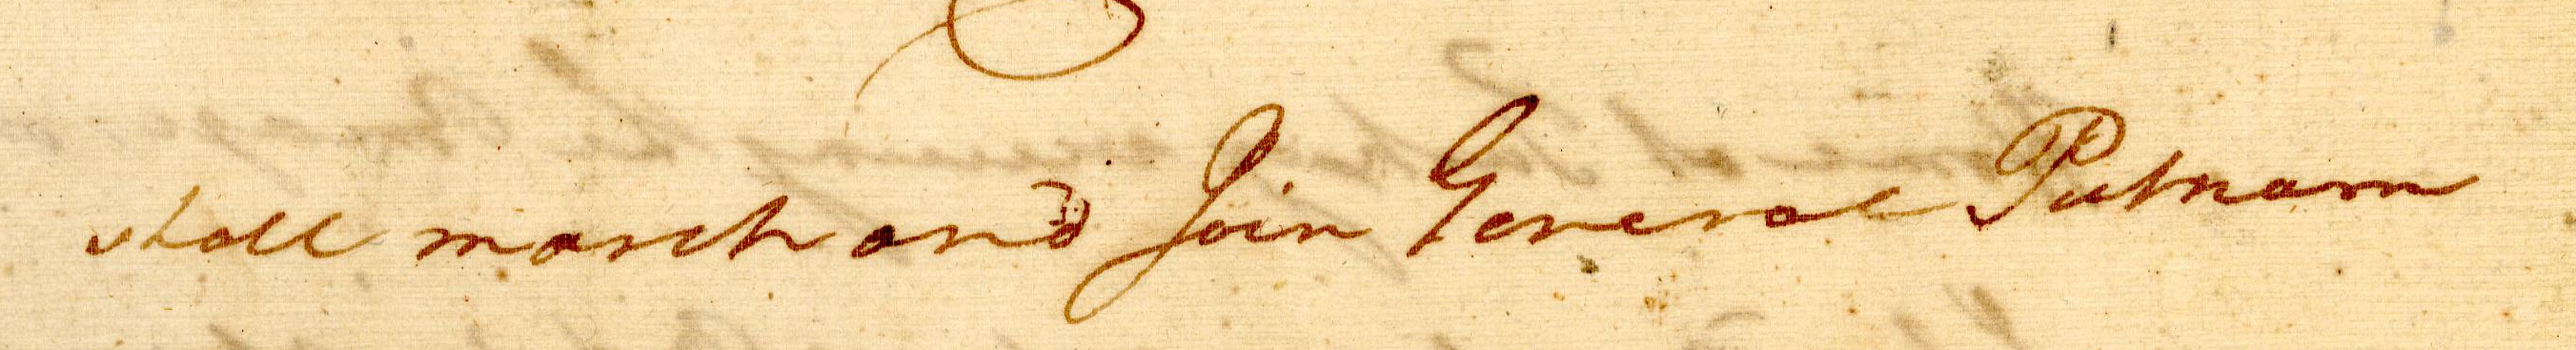shall march and Join General Putnam
